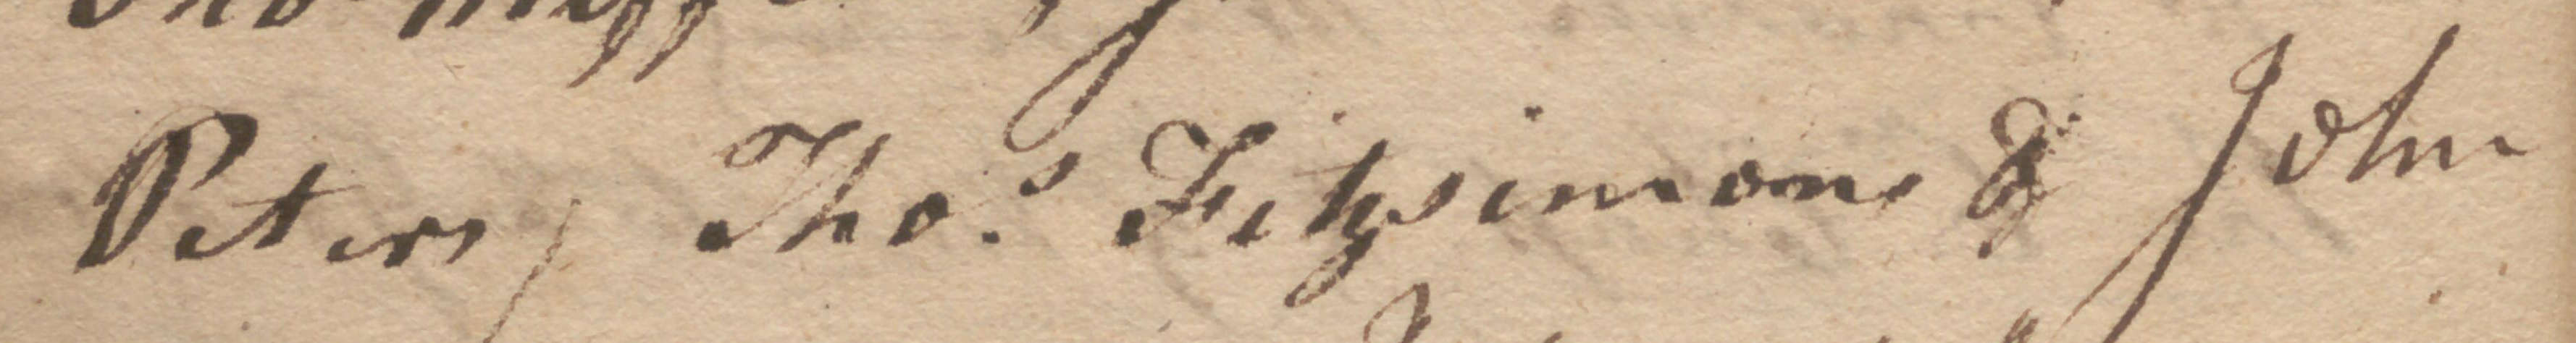Peters, Tho^s. Fitzsimons & John
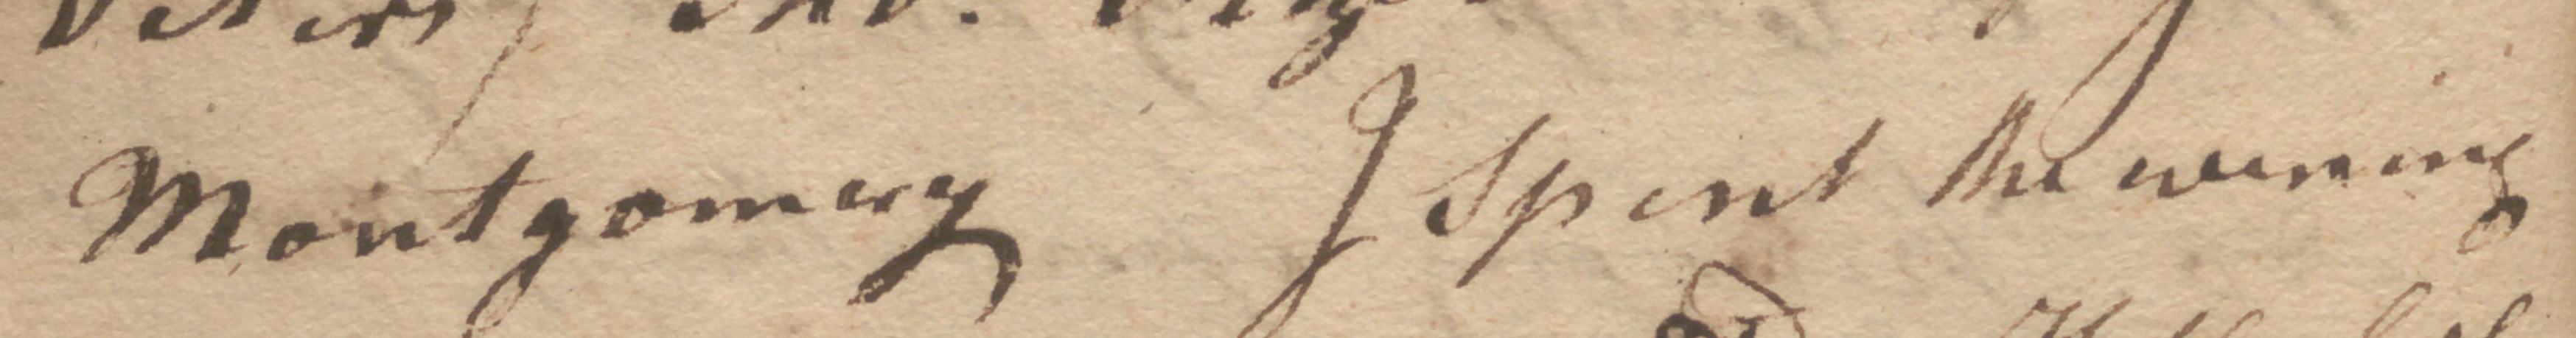Montgomery I spent the evening
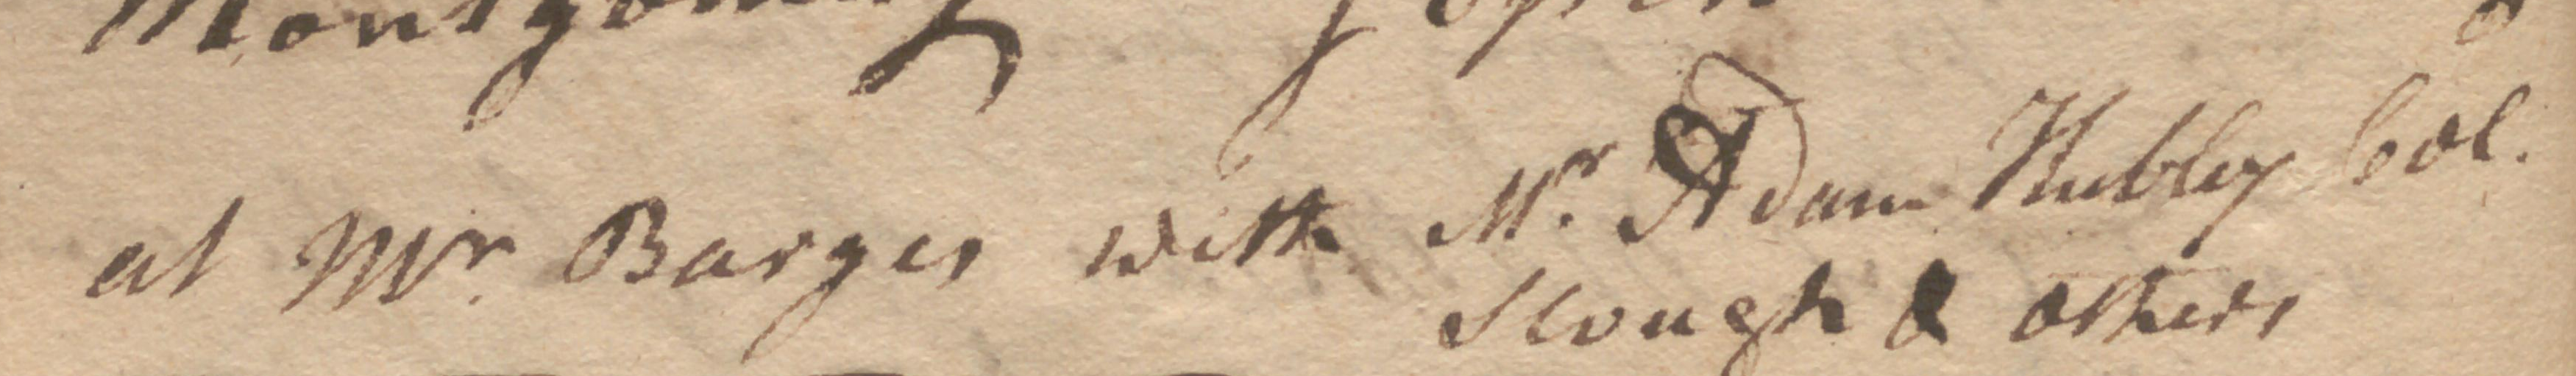at M^r. Barges with M^r. Adam Hubley Col
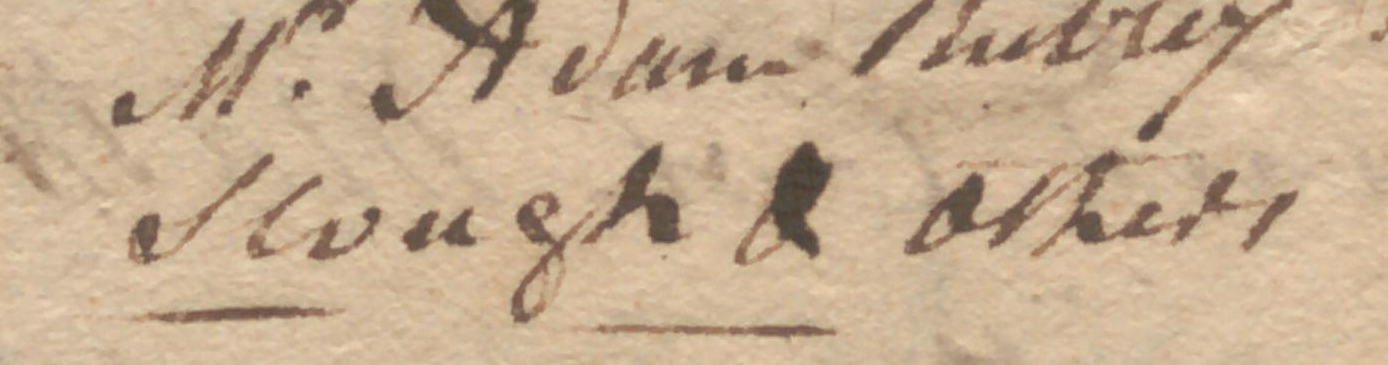Slough & others
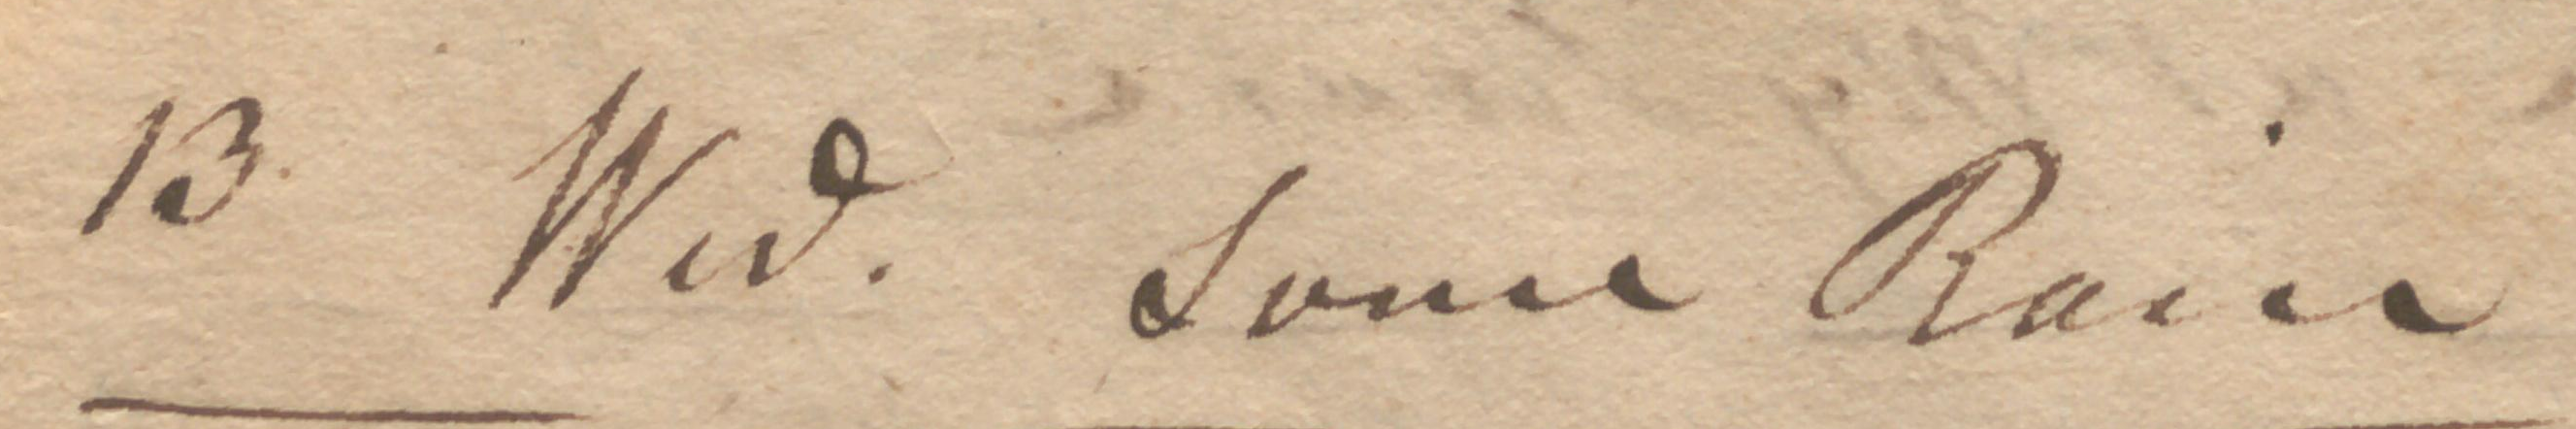13 Wed. some Rain
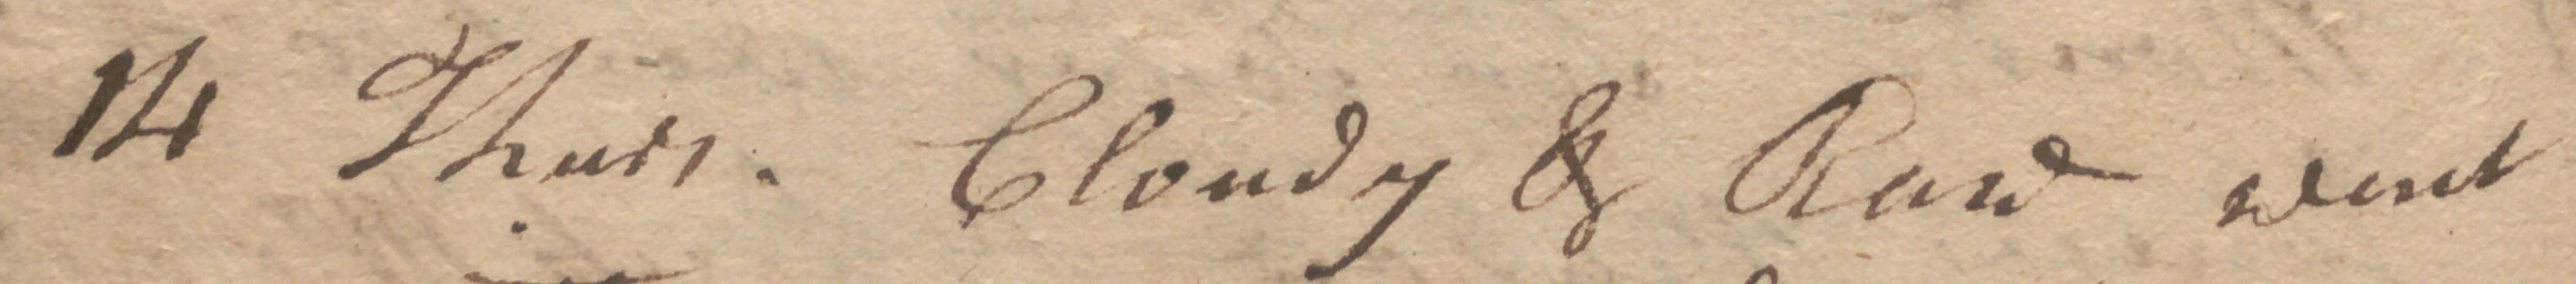14 Thurs. Cloudy & Raw went
